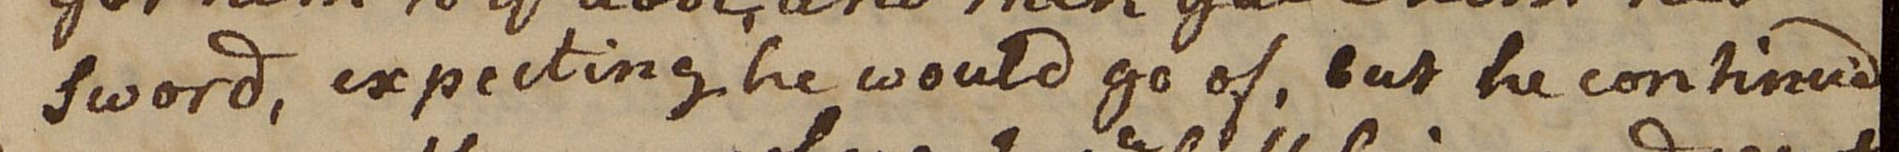Sword, expecting he would go of, but he continu'd
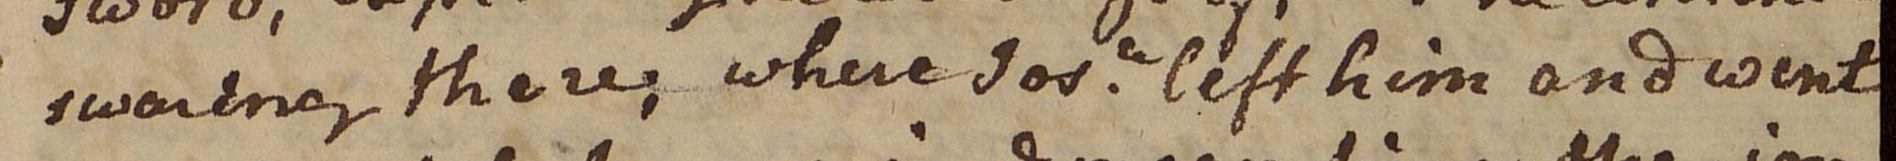swaring there; where Jos^a. left him and went
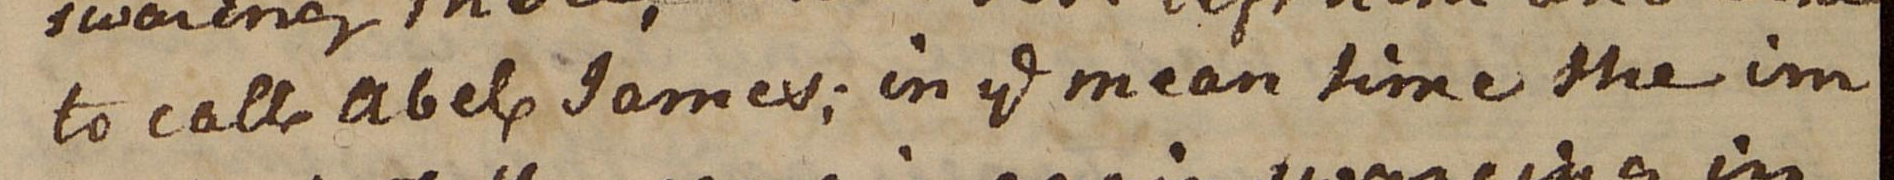to call Abel James; in y^e mean time the im
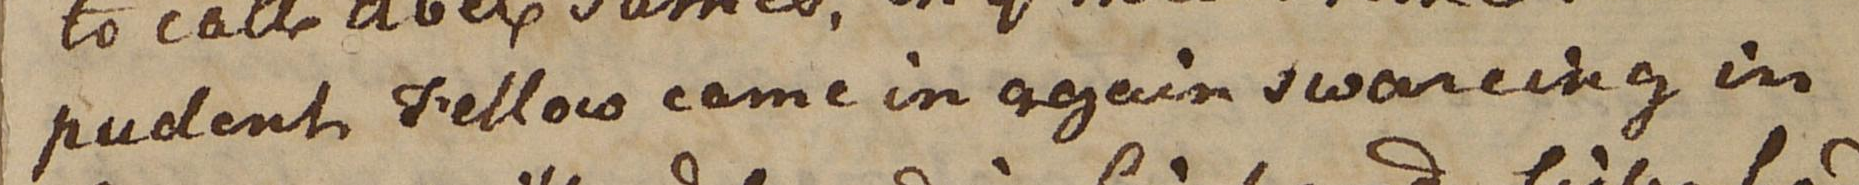pudent Fellow came in again swareing in
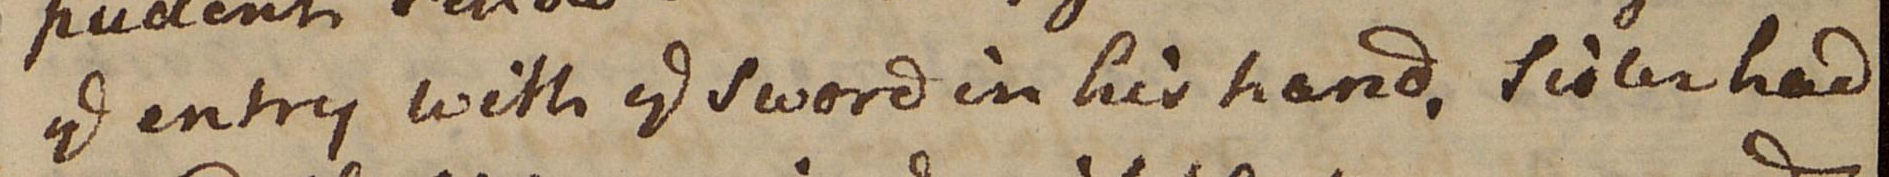y^e entry with y^e Sword in his hand, Sister had
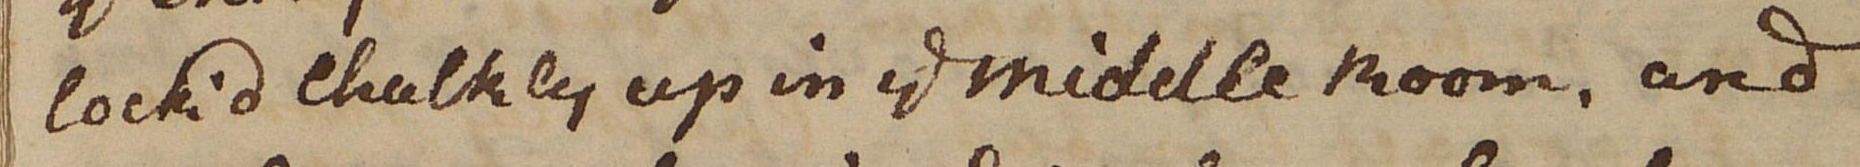lock'd Chalkly up in y^e Middle Room, and
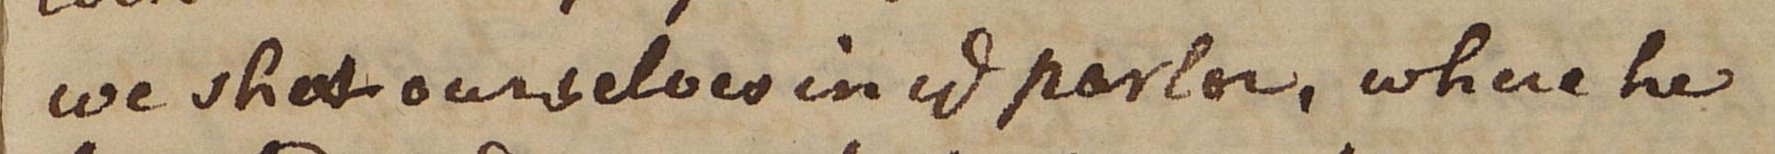we shut ourselves in y^e parlor, where he
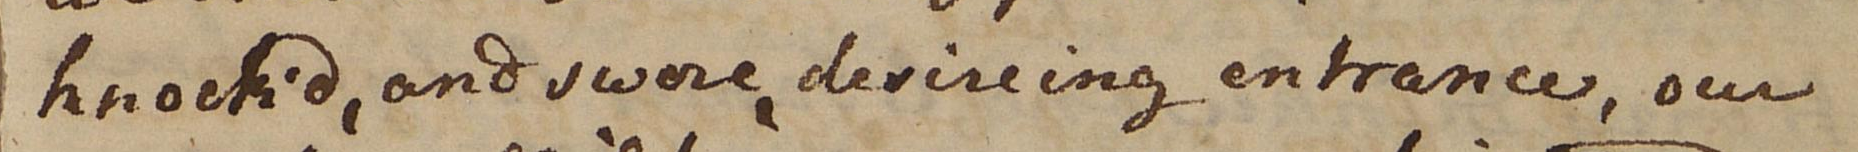knock'd, and sware, desireing entrance, our
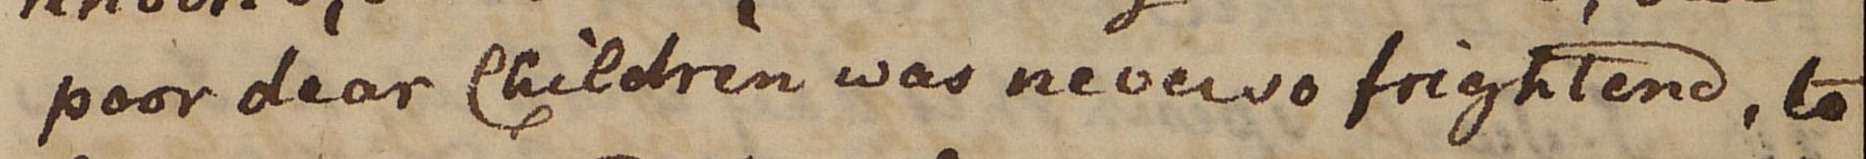poor dear Children was never so frightend, to
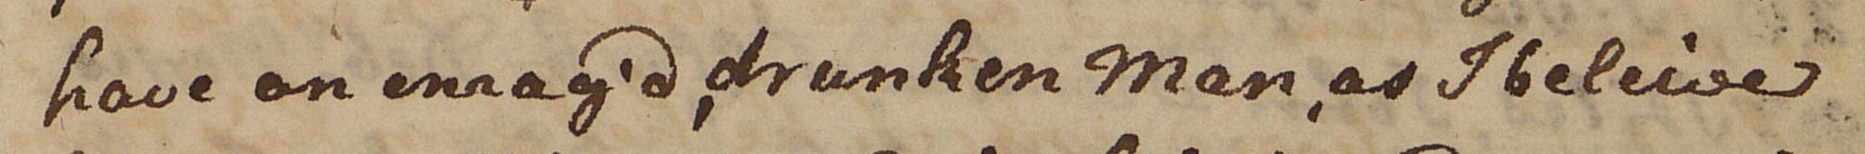have an enrag'd, drunken Man ,as I beleive
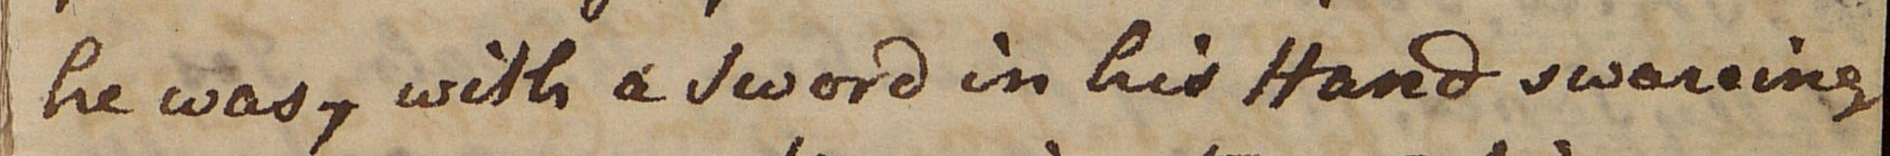he was, with a Sword in his Hand swareing
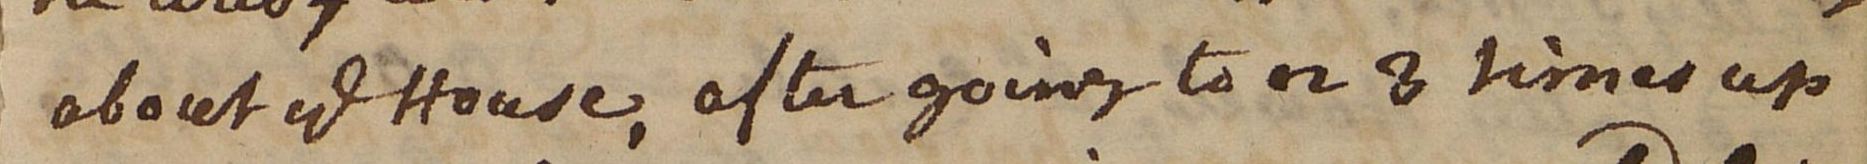about y^e House, after going to or 3 times up
